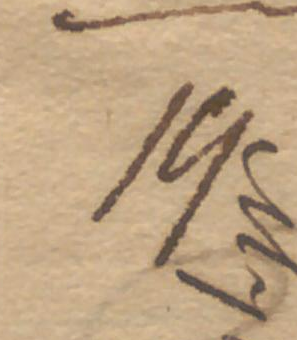19
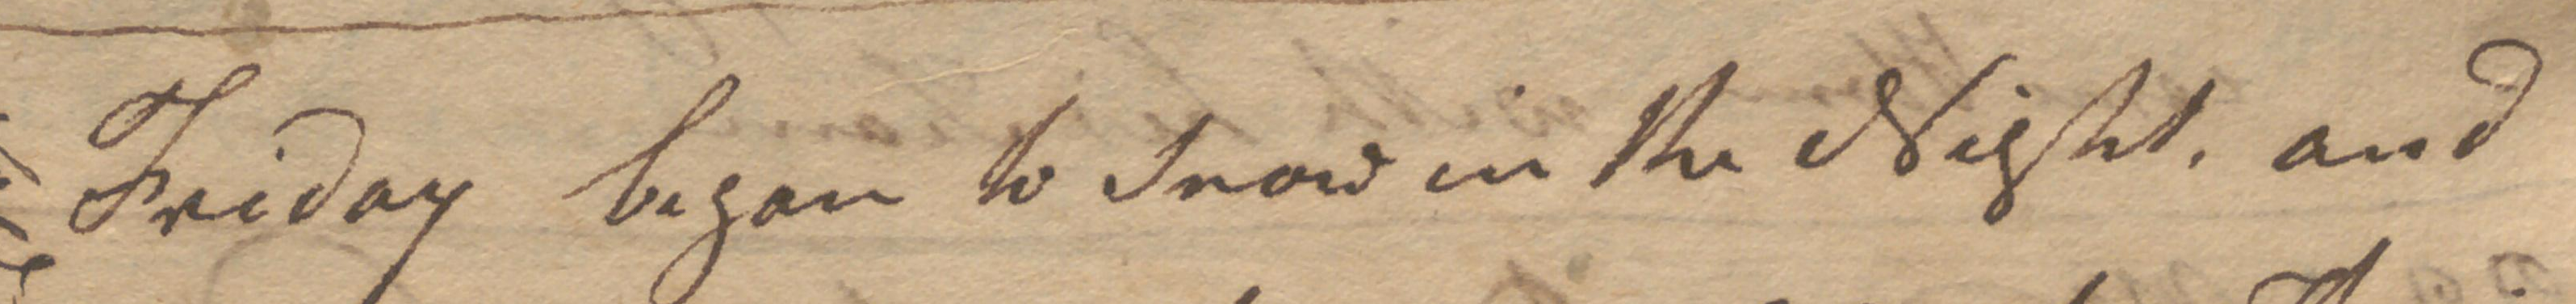Friday began to snow in the Night, and
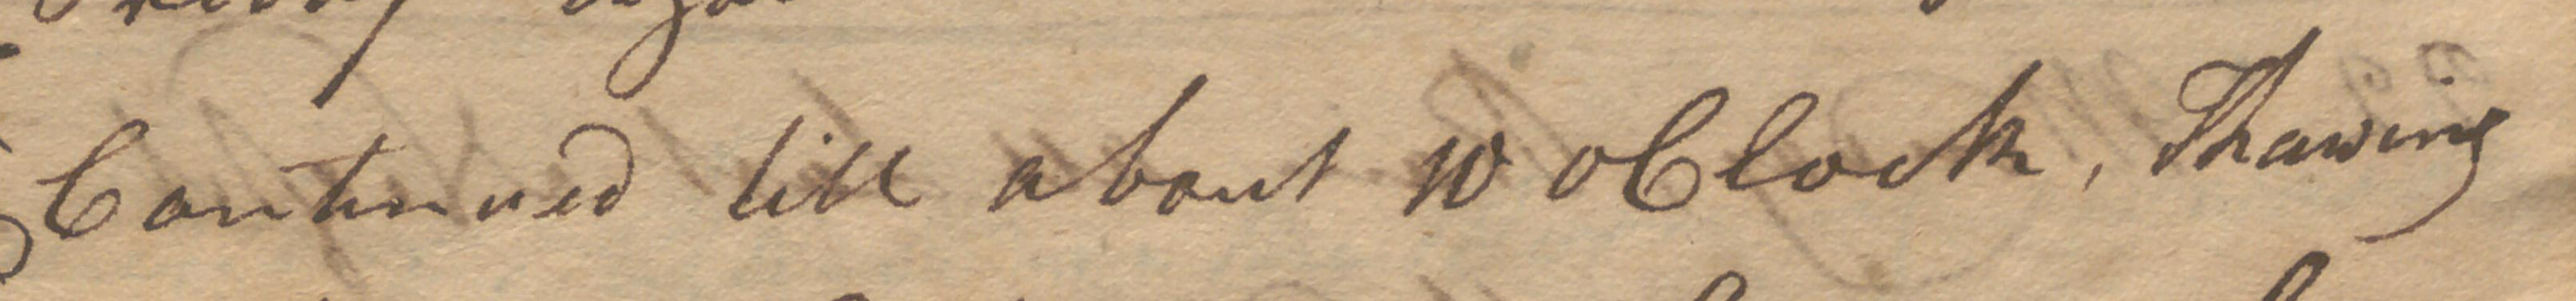Continued till about 10 oClock, Thawing
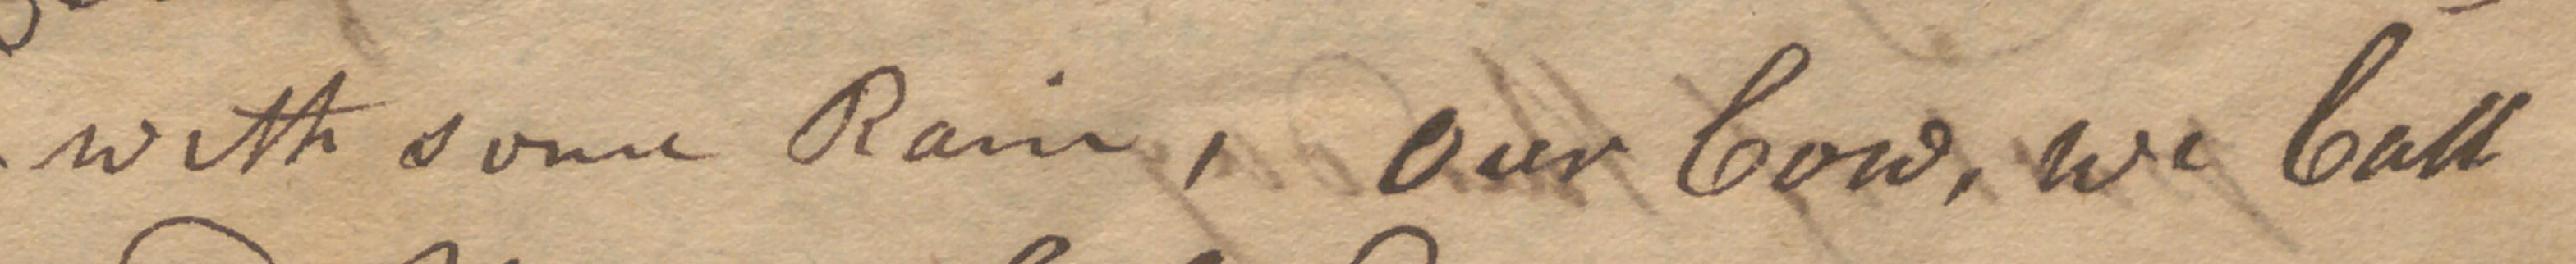with some Rain, our Cow, we Call
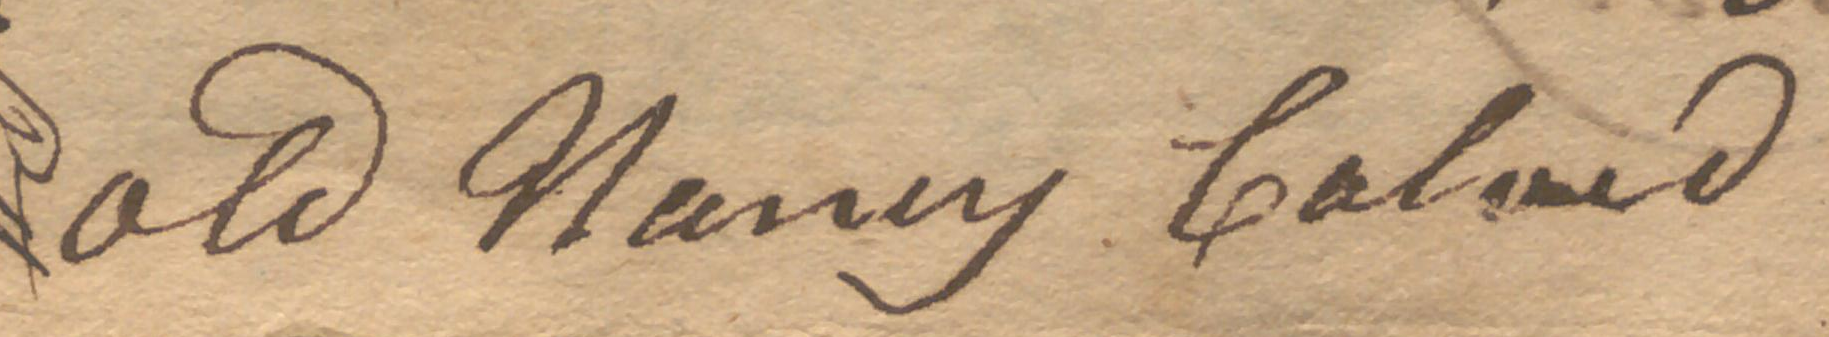old Nancy Calved
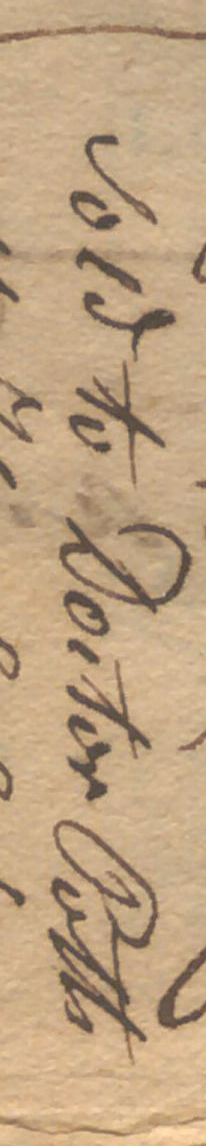old to Doctor Potts
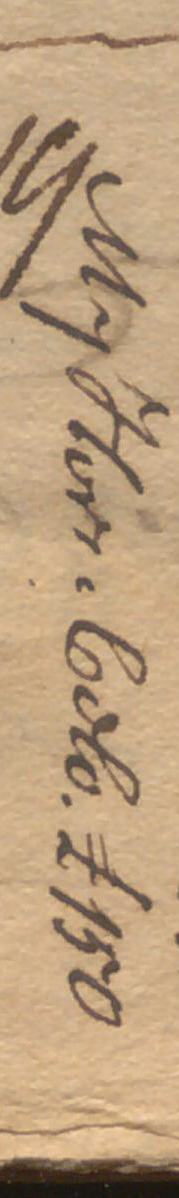My Horse Colo. £150
